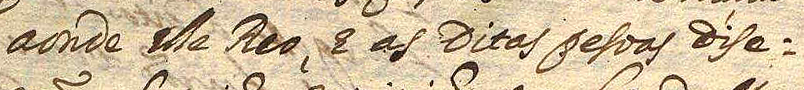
aonde Elle Reo, E as ditas pesoas dise
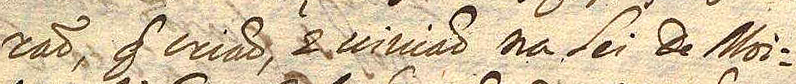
raõ, q̄ criaõ, E uiuiaõ na lei de Moi
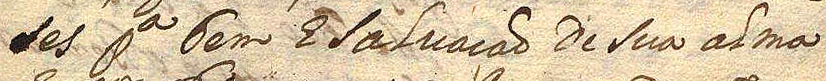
ses pa bem E saluação de sua alma
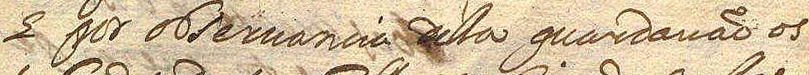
E por obseruancia della guardauão os
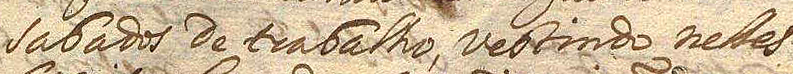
sabados de trabalho, vestindo nelles
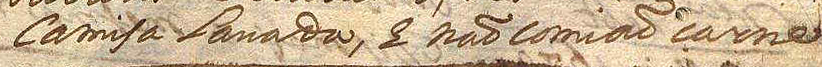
camisa lauada, E naõ comiaõ carne
